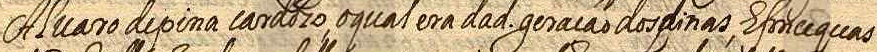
Aluaro de pina cardozo, o qual era da d. geração dos pinas, E foncequas
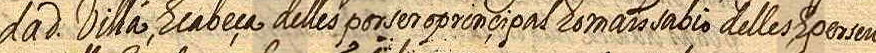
da d. Villa, E cabeça delles por ser o principal E o mais sabio delles, E per seu
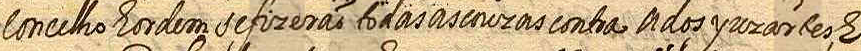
concelho E ordem se fizerão todas as couzas contra a dos yuzartes, E
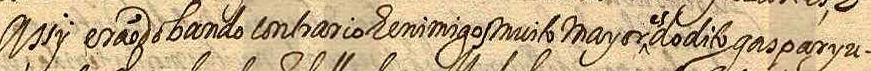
assy erão do bando contrario E enimigos muito mayores do dito gaspar yu
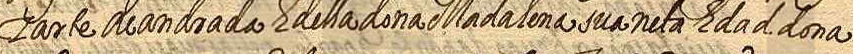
zarte de andrada E della dona Madalena sua neta E da d. dona
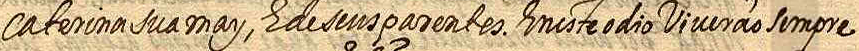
caterina sua may, E de seus parentes E neste odio Viuerão sempre
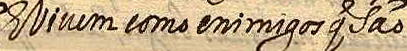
E Viuem como enimigos q̄ são
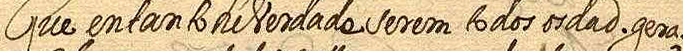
Que entanto he Verdade serem todos os da d. gera
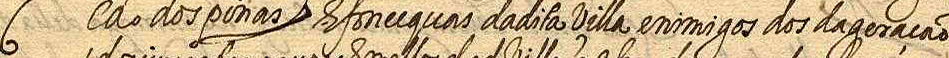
6 ção dos pinas E foncequas da dita villa enimigos dos da geração
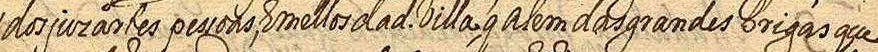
dos juzartes pessoas, E mellos da d. Villa, q̄ alem das grandes brigas que
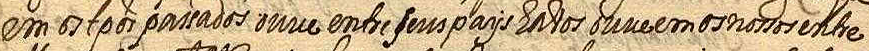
em os tpōs passados ouue entre seus pays E avos ouue em os nossos entre
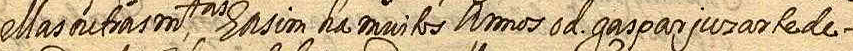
ellas outras mtas, E asim ha muitos annos o d. gaspar juzarte de
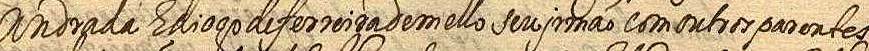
Andrada E diogo de ferreira de mello seu jrmão com outros parentes
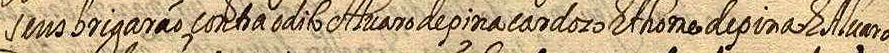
seus brigarão contra o dito Aluaro de pina cardozo E thome de pina E Aluaro
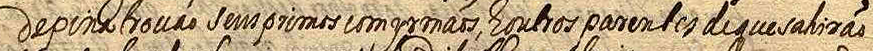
de pina trouão seus primos com yrmãos, E outros parentes de que sahirão
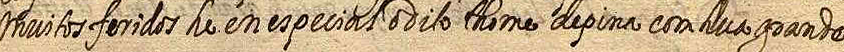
muitos feridos he en especial o dito thome de pina com hua grande
